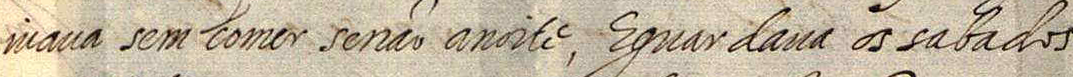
iuaua sem comer senaõ a noite, E guardaua os sabados
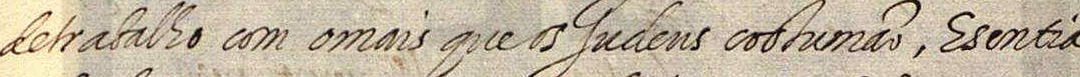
de trabalho com o mais que os Judeus costumaõ, E sentia
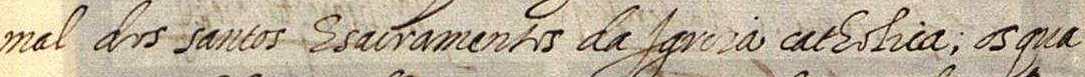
mal dos santos E sacramentos da Jgreia catholica; os qua
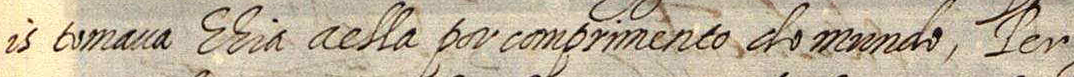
is tomaua e hia a ella por comprimento do mundo, Per
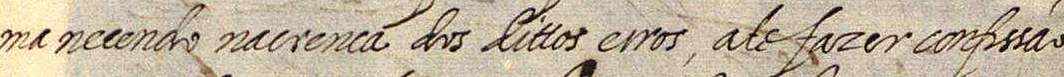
manecendo na crenca dos dittos erros, ate fazer confissaõ
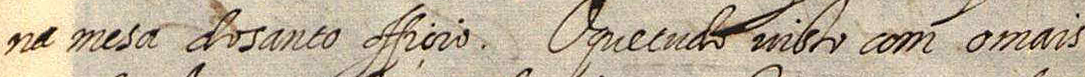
na mesa do santo offiçio. O que tudo uisto com o mais
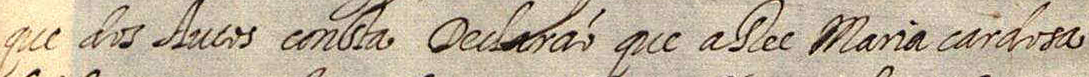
que dos Autos consta Declaraõ que a Ree Maria cardosa
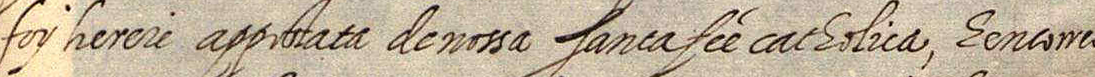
foy hereie appostata de nossa santa feé catholica, E encorreo
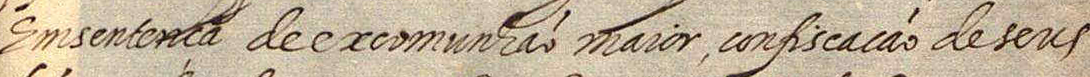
Em sentença de excomunhaõ maior, confiscacaõ de seus
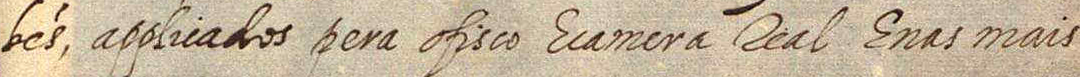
bēs, applicados pera o fisco E camera Real E nas mais
